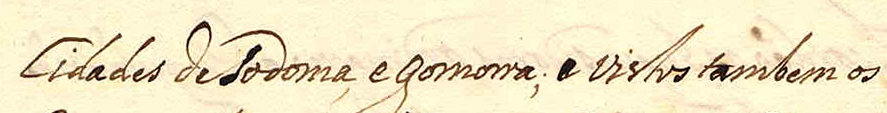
Cidades de Sodoma, e gomorra, e vistos tambem os
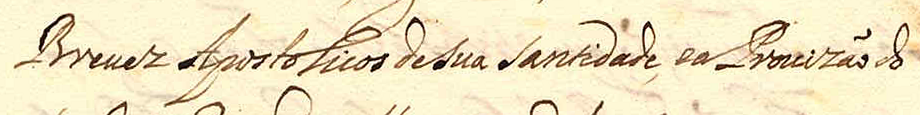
Breuez Apostolicos de sua santidade, e a Prouizão do
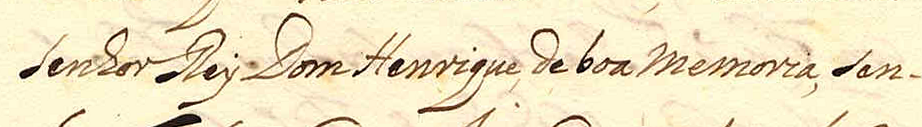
senhor Rey Dom Henrique, de boa Memoria, sen
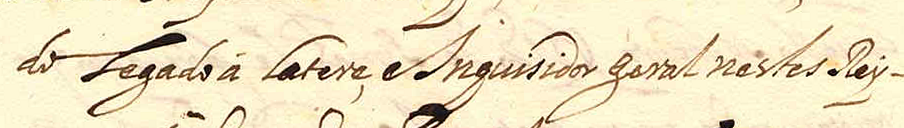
do Legado á latere, e Inquisidor geral nestes Rey
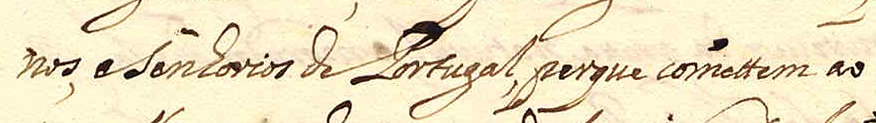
nos, e Senhorios de Portugal, perque com̄ettem ao
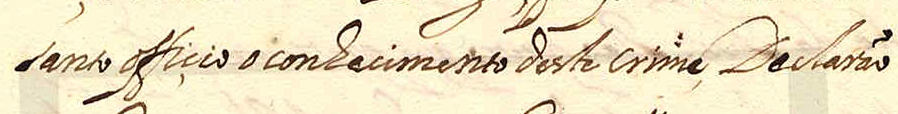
santo officio o conhecimento deste crime, Declarão
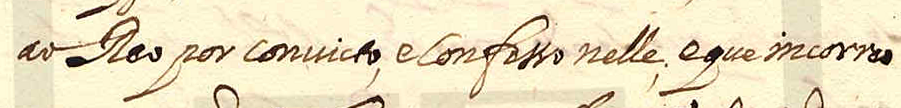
ao Reo por conuicto, e confesso nelle, e que incorreo
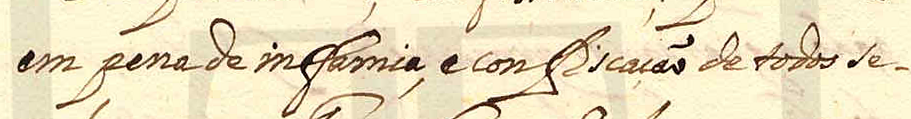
em pena de infamia, e confiscaçaõ de todos se
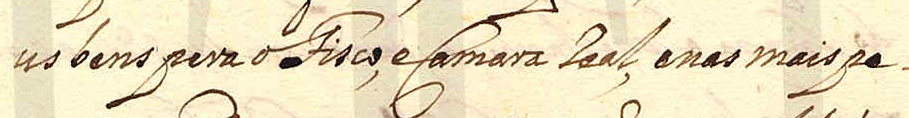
us bens pera o Fisco, e Camara Real, e nas mais pe
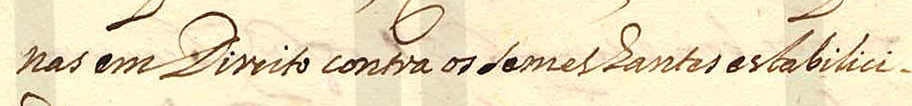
nas em Direito contra os semelhantes estabilici
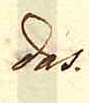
das.
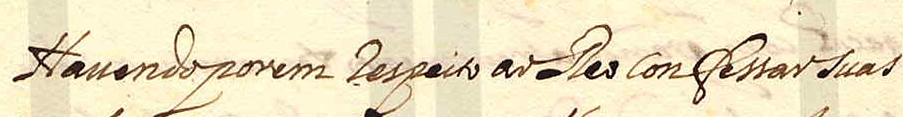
Hauendo porem Respeito ao Reo confessar suas
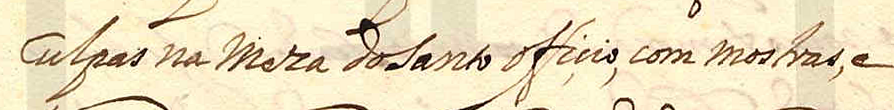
Culpas na Meza do santo officio, com mostras, e
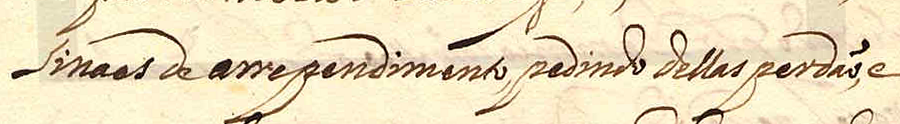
sinaes de arrependimento, pedindo dellas perdaõ, e
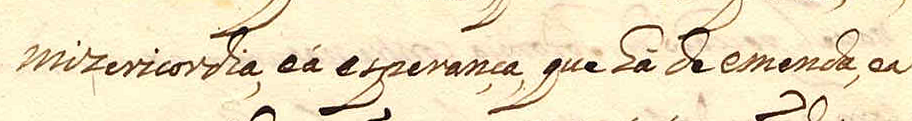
mizericordia, e á esperança, que há de emenda, e a
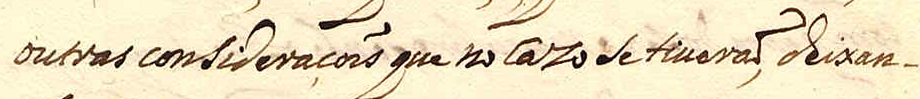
outras consideraçoẽs que no cazo se tiueraõ, deixan
